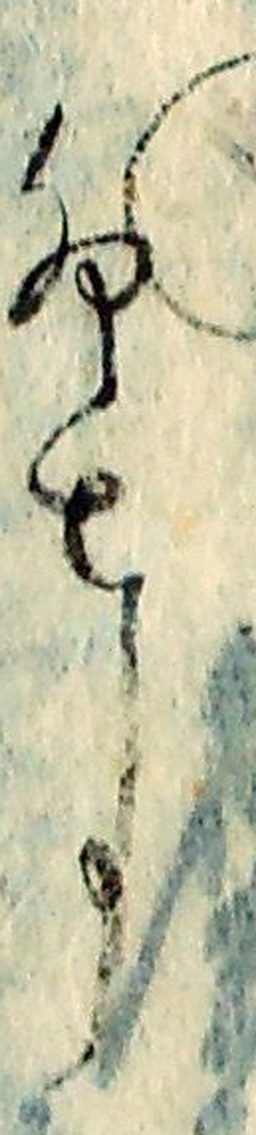卯七月
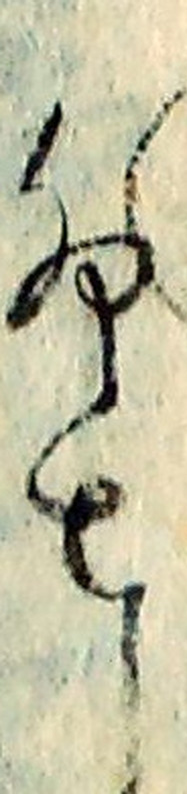卯七月
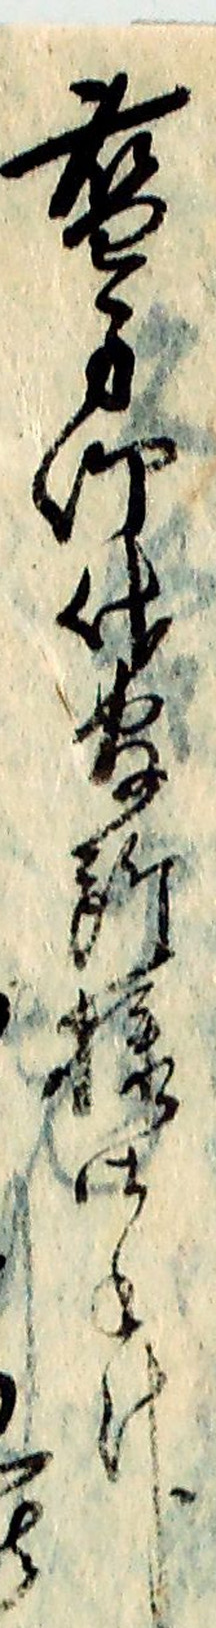藍方御代官所様御手代
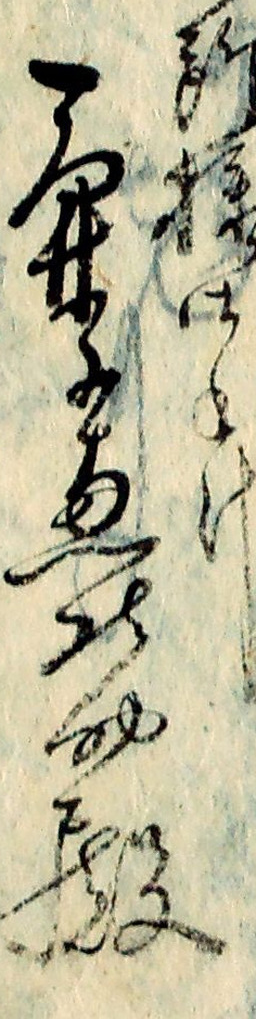兼子恵次助殿
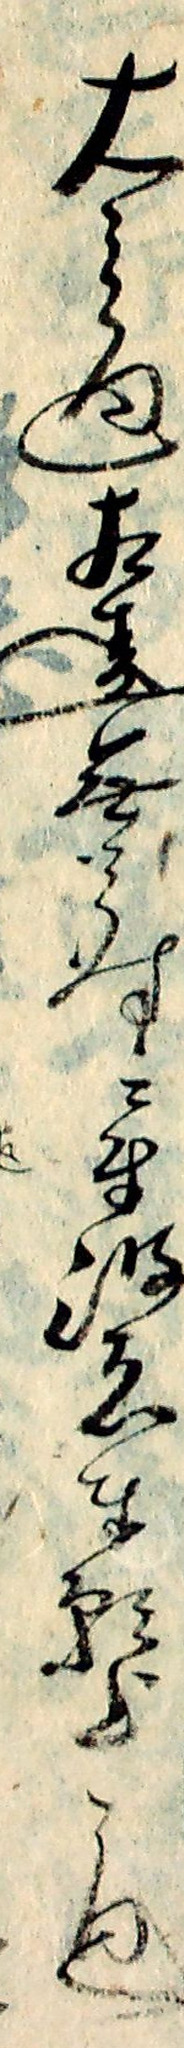右之通相違無御座候に付彼者奉願上通
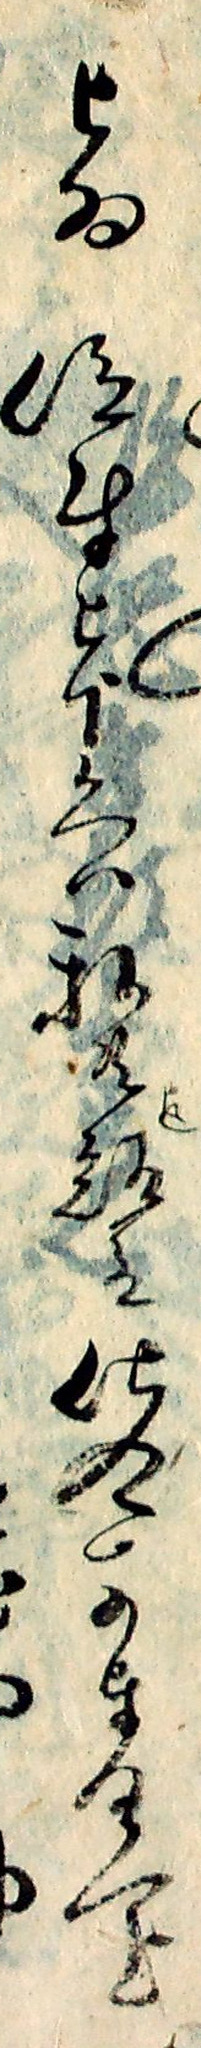被為仰付被下候へは私共迄難有仕合可奉存候以上
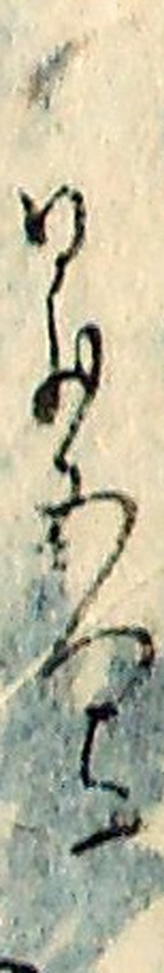同村五人与
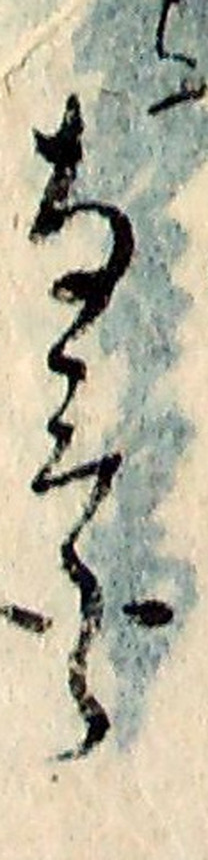与三郎
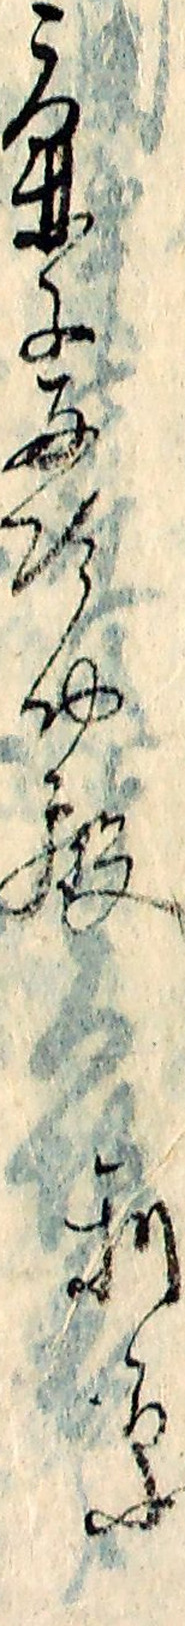兼子両次助殿利兵衛

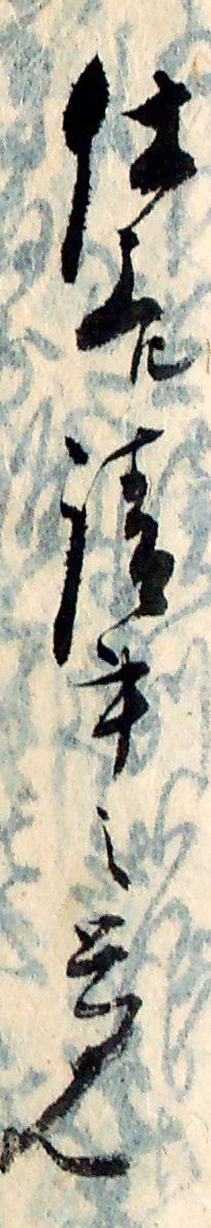仕上る請書之覚
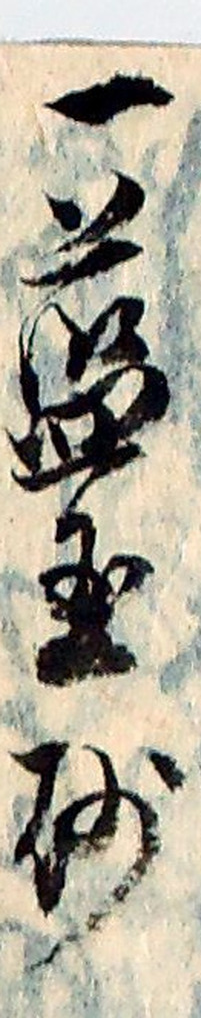一藍玉砂
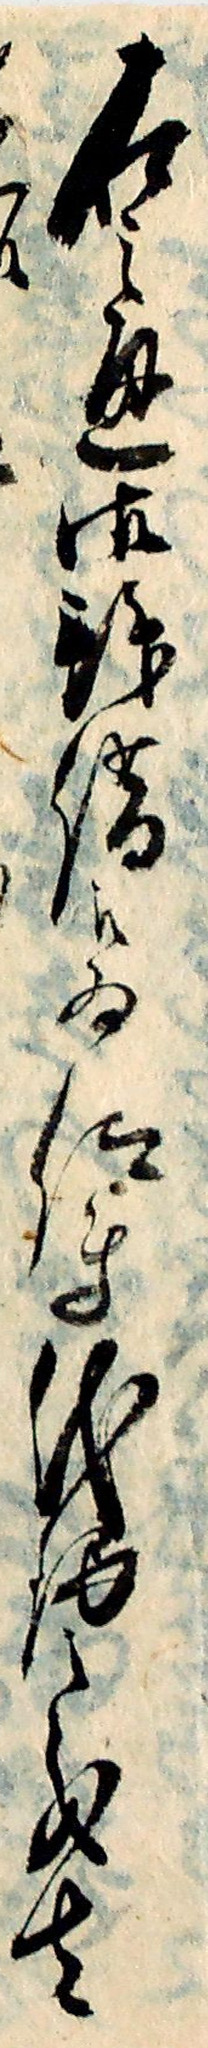右之通御拝借被為仰付代銀之義は
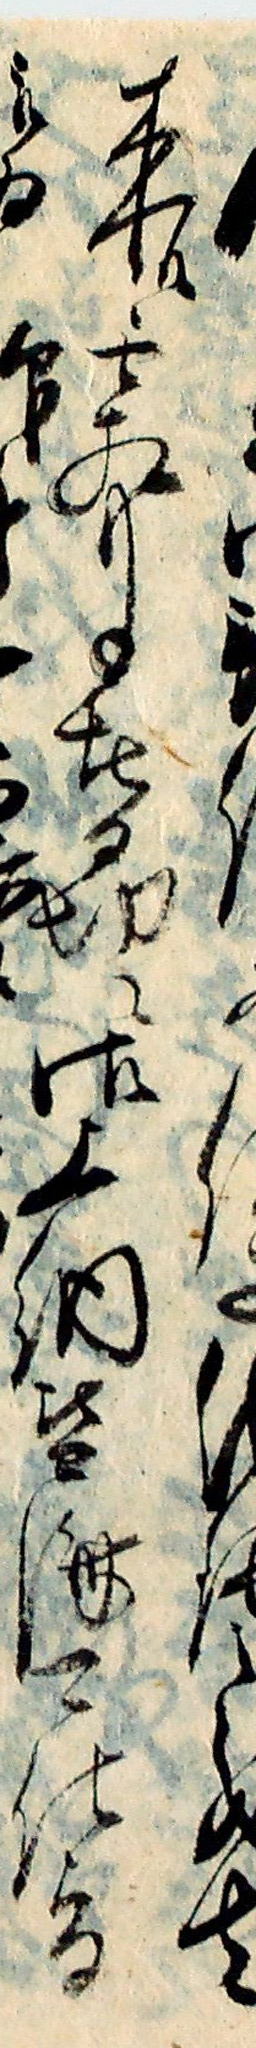来る霜月廿日切に御上納皆済可仕旨
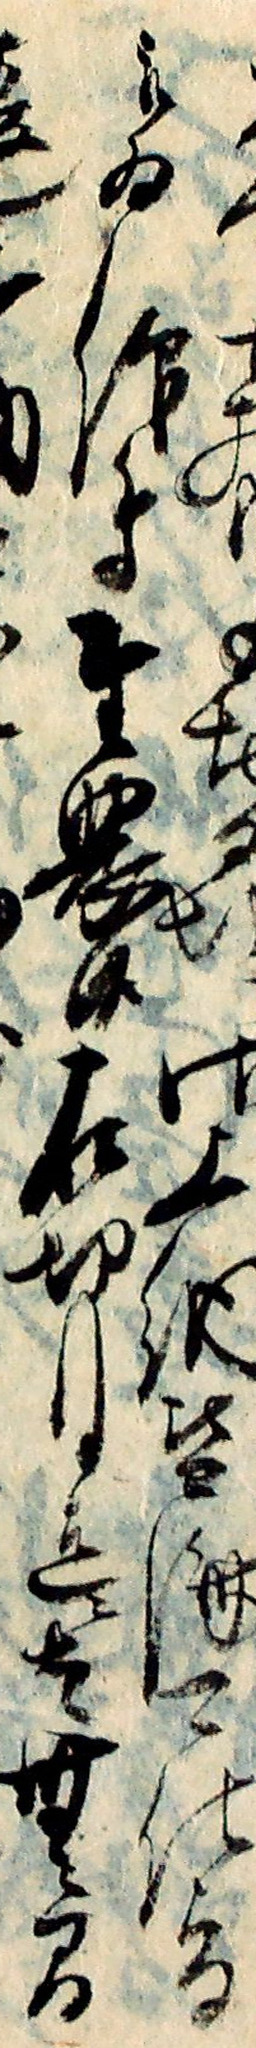被為仰付奉畏候右切月迄には無間
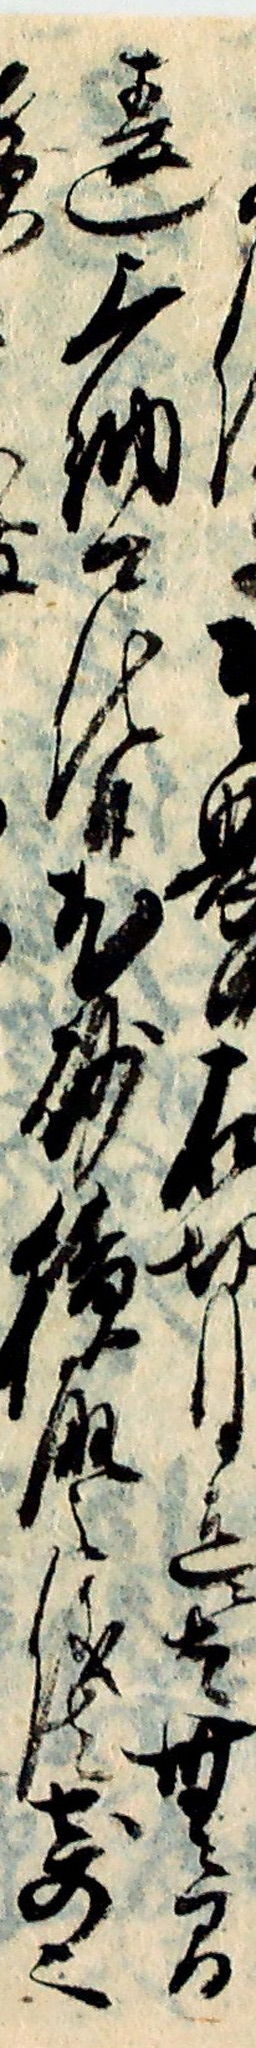違上納可仕候尤砂積取之儀は寄々
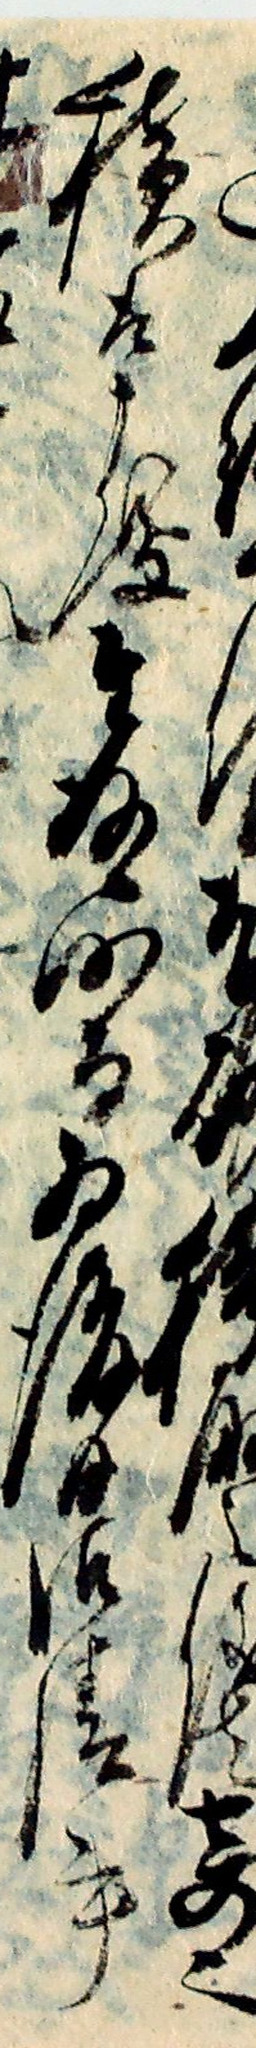積取申度奉存候仍て為後日御請書
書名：諸御願書控(後藤氏壱番）
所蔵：鳴門教育大学 Naruto University of Education
